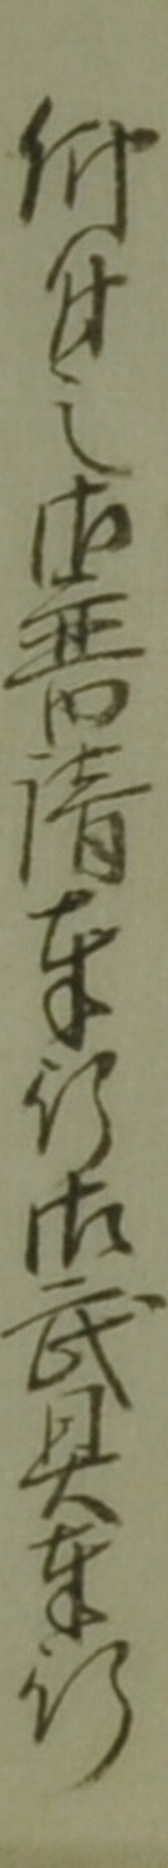仰付之御普請奉行御武具奉行
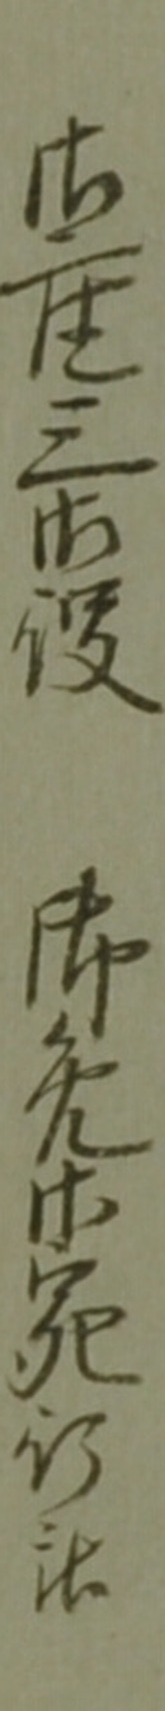御座三御役御免御宛行被
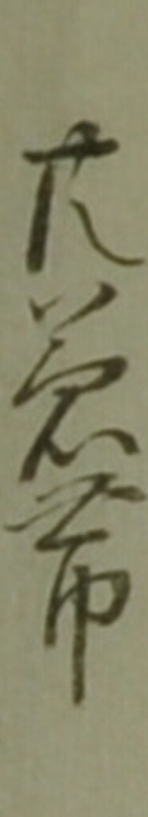共兼帯
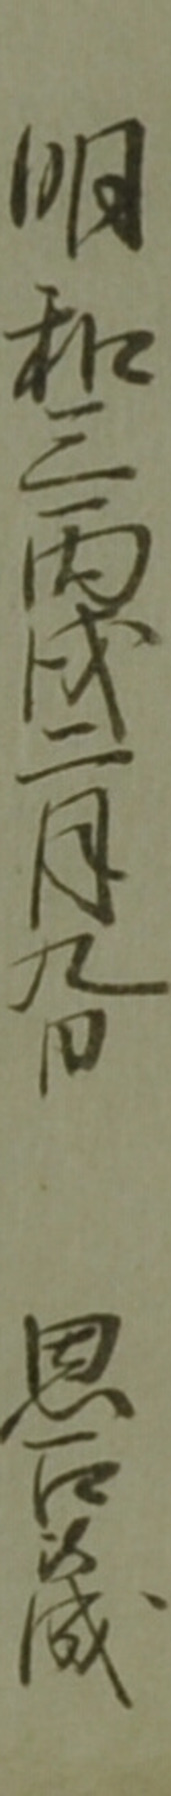明和三丙戌二月九日思召被成
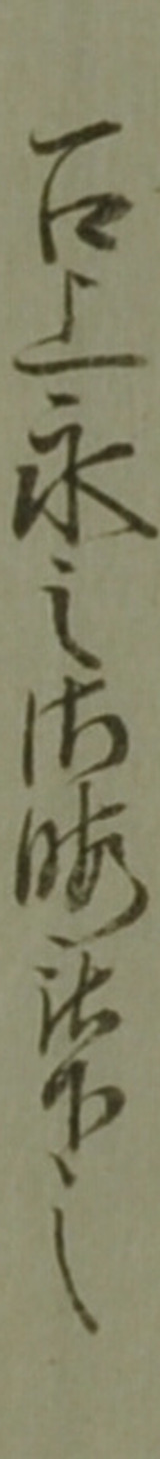召上永之御暇被下之
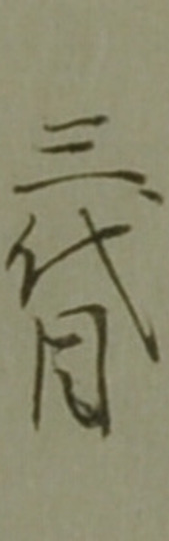三代目
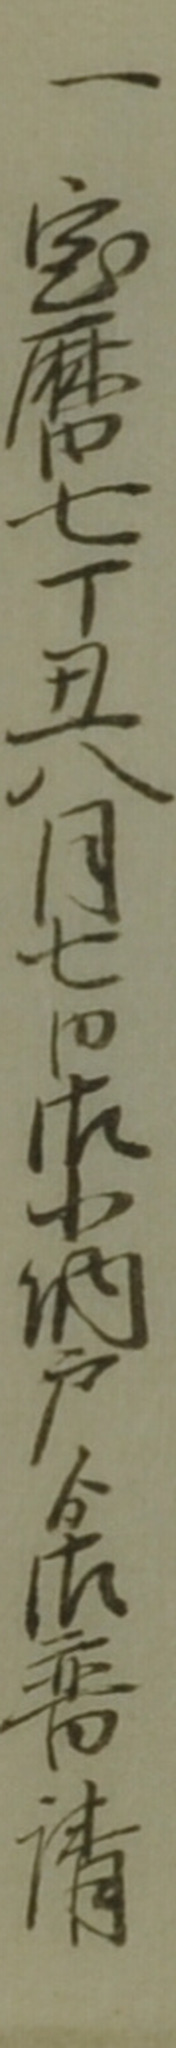一宝暦七丁丑八月七日御小納戸ゟ御普請
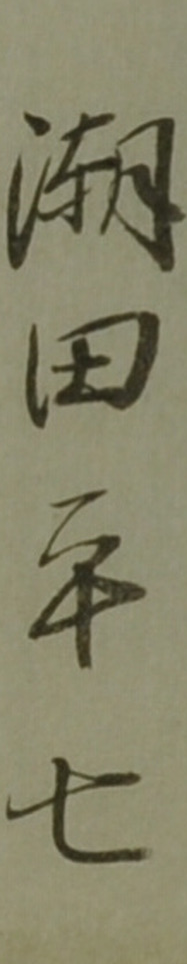潮田平七
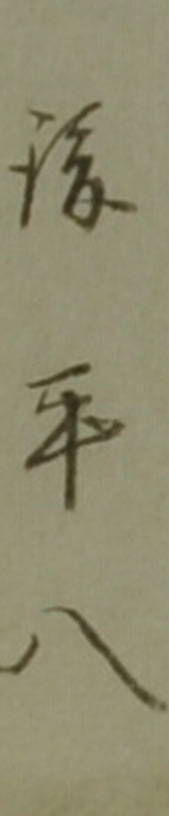後平八
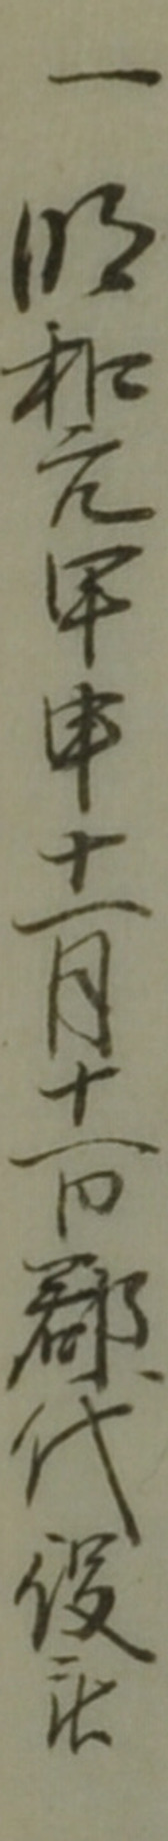一明和元甲申十一月十一日郡代役被
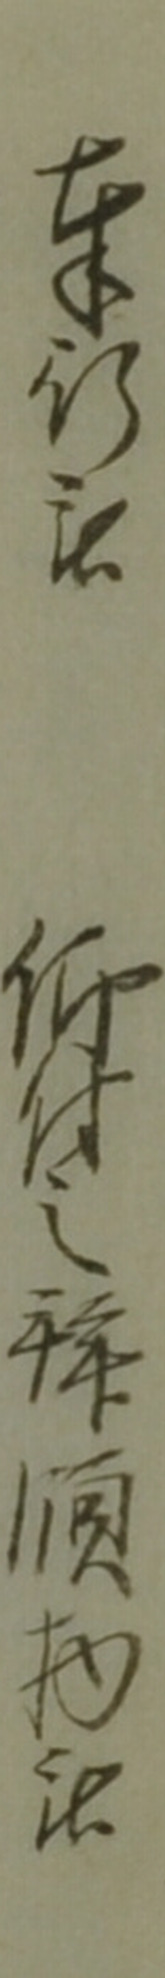奉行被仰付之拝領物被
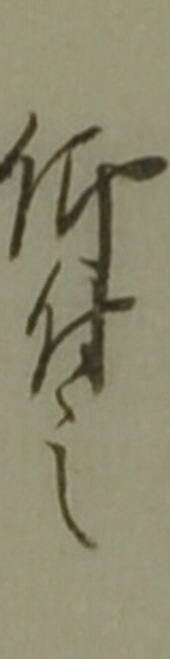仰付之
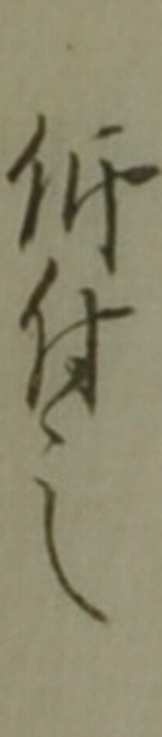仰付之
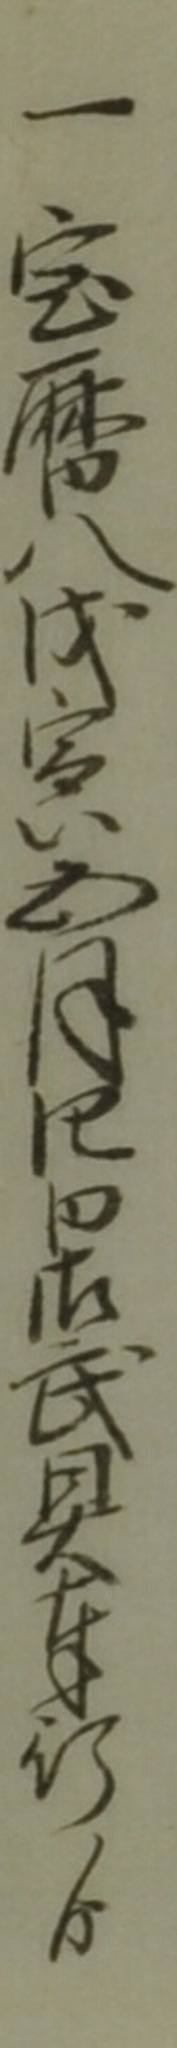一宝暦八戊寅五月四日御武具奉行ゟ
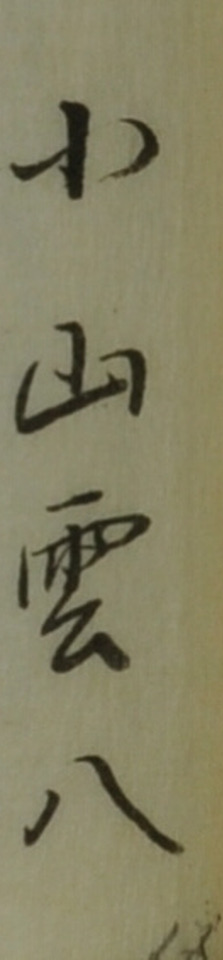小山雲八
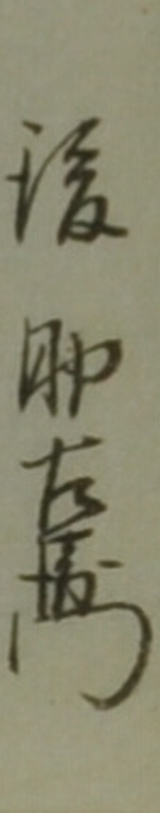後助左衛門
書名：諸御役代々録（六）
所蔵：伊那市立高遠町図書館・合同会社AMANE
